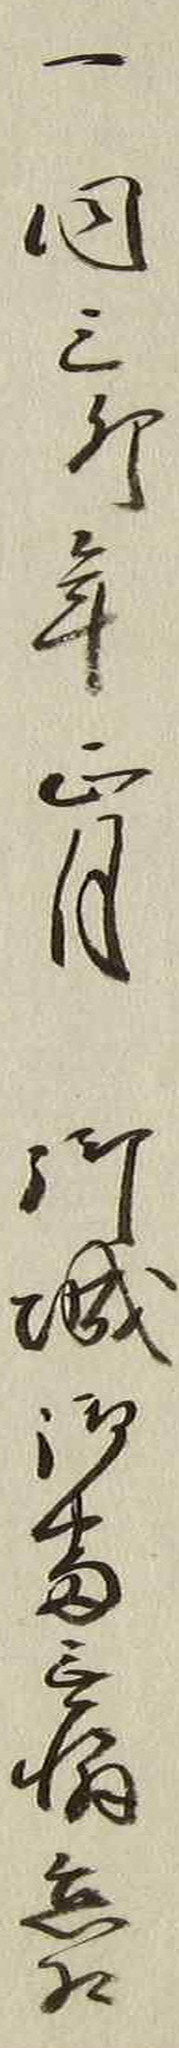一同三卯年正月御城御番無懈怠相
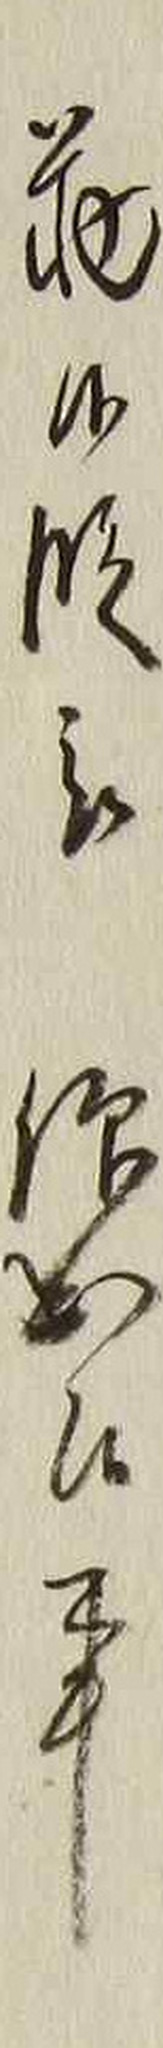勤候段被仰出候事
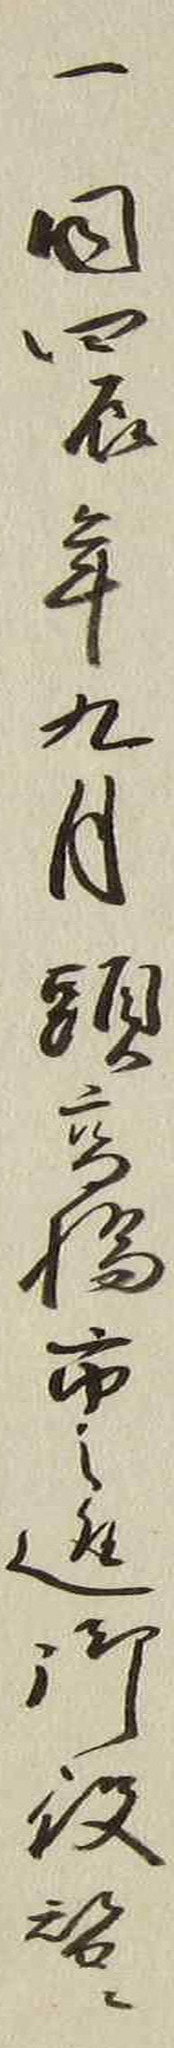一同四辰年九月頭高橋市之進御役替ニ
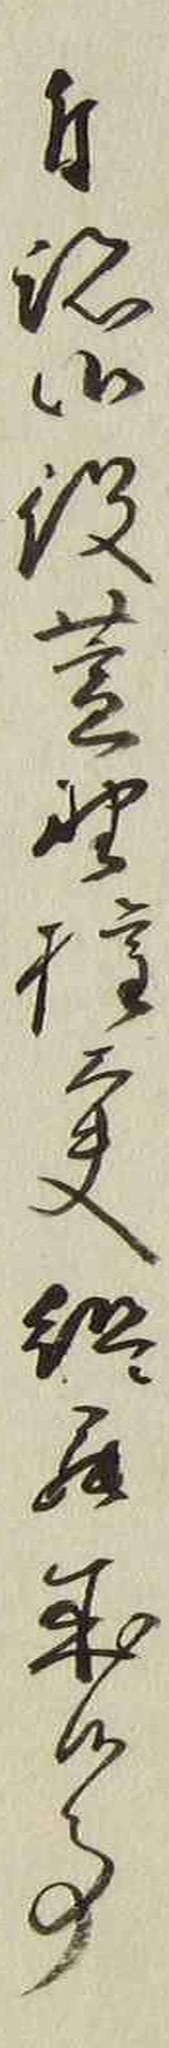付跡御役菅野権大夫組ニ罷成候事
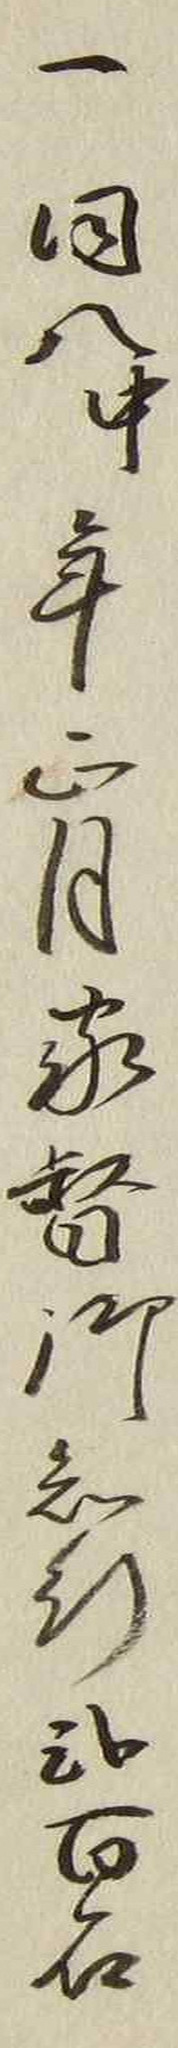一同八申年正月家督御知行弐百石
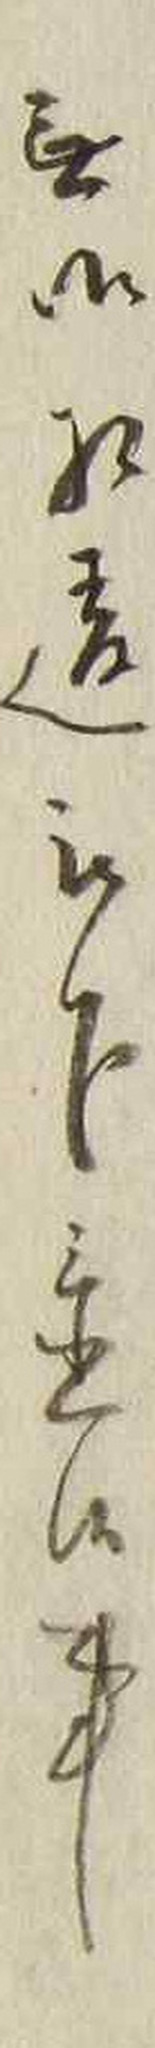無御相違被下置候事

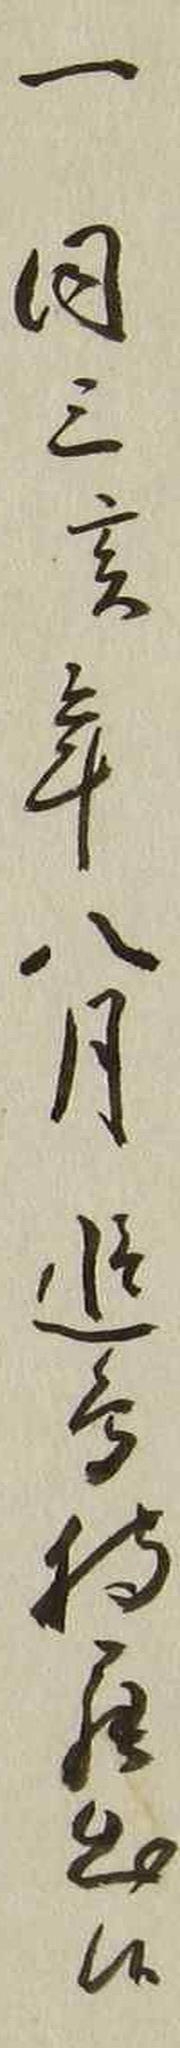一同三亥年八月追鳥狩罷出候
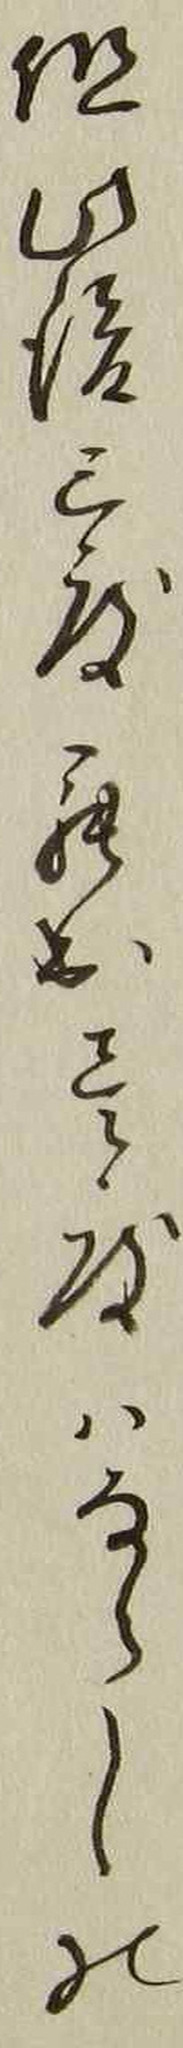但此後三度罷出壱度ハならしの
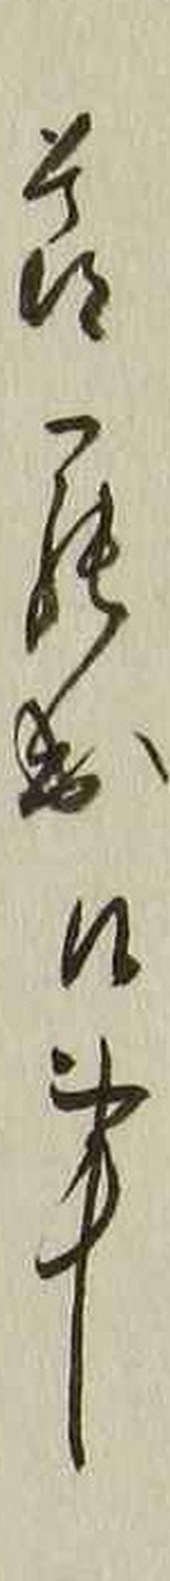節罷出候事
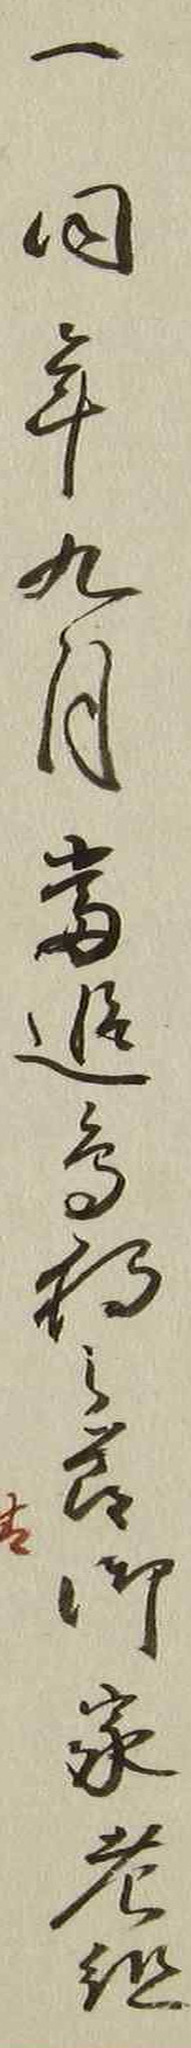一同年九月当追鳥狩之節御家老組
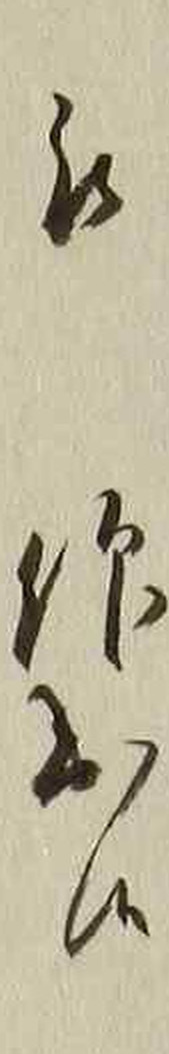被仰出候
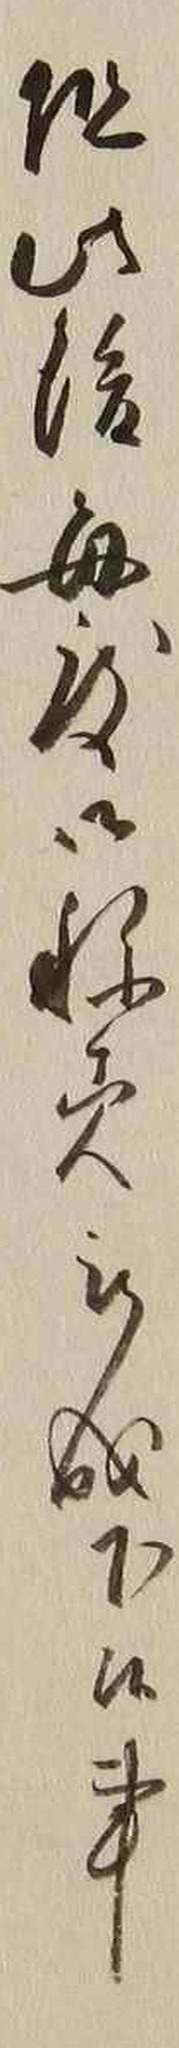但此後毎度御称美被成下候事
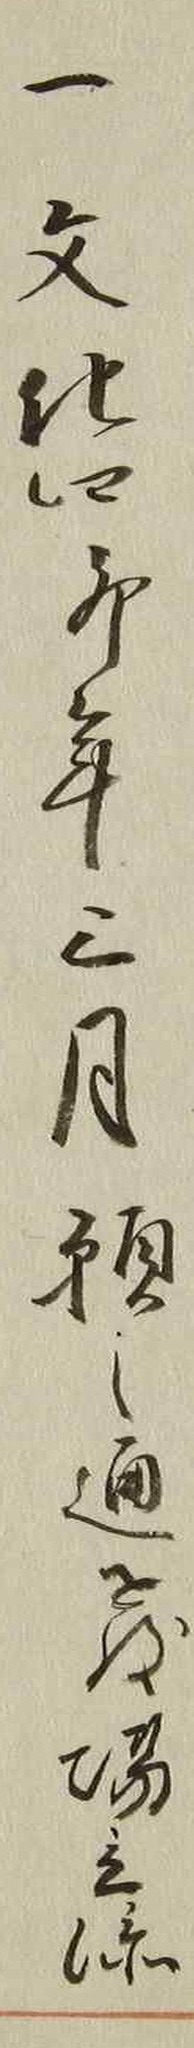一文化四卯年三月願之通教場立添
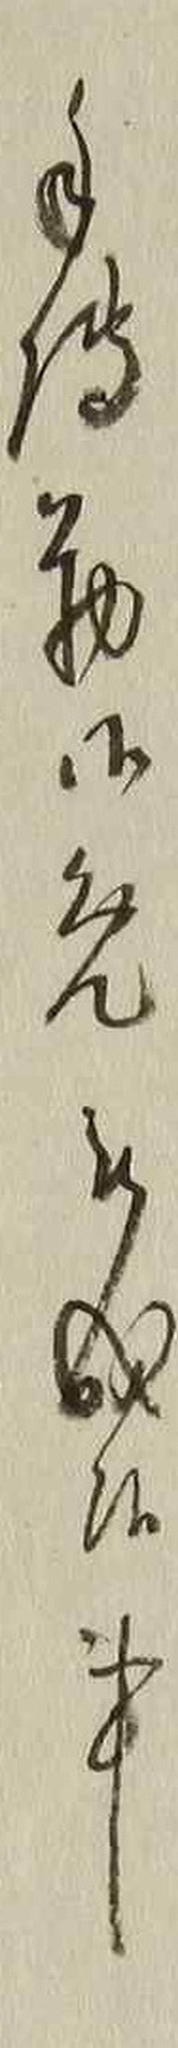手伝勤御免被成候事
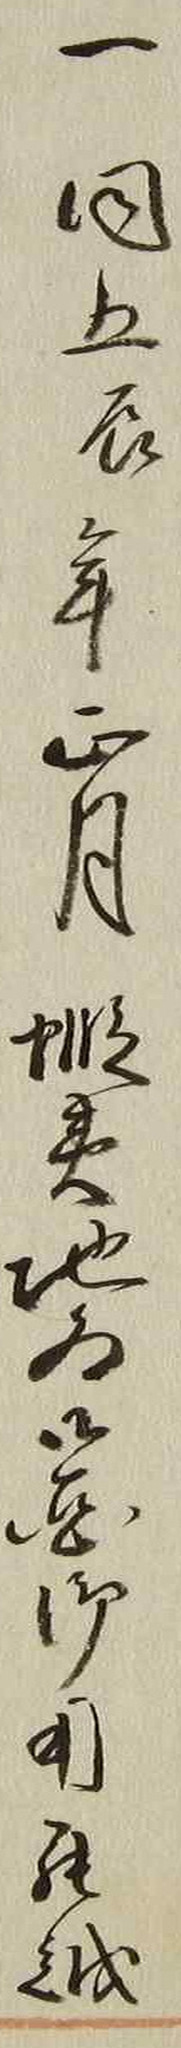一同五辰年正月蝦夷地為御固御用罷越
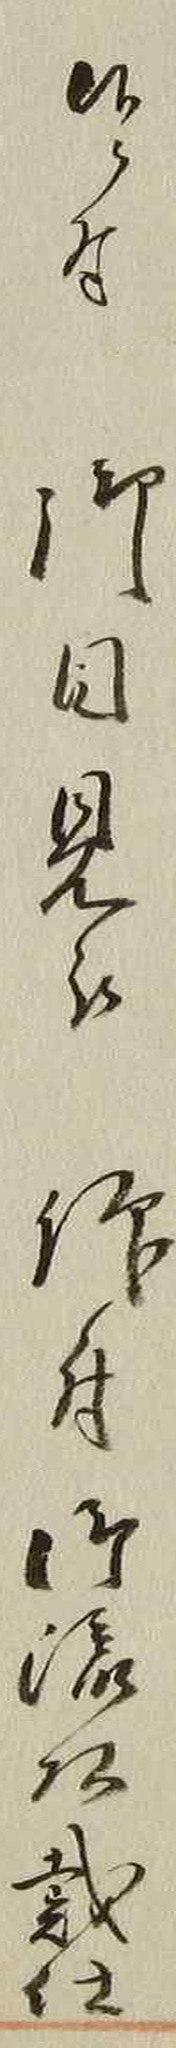候ニ付御目見被仰付御流頂戴仕
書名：諸士系譜　巻之122　よ之部5
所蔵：会津若松市立会津図書館
